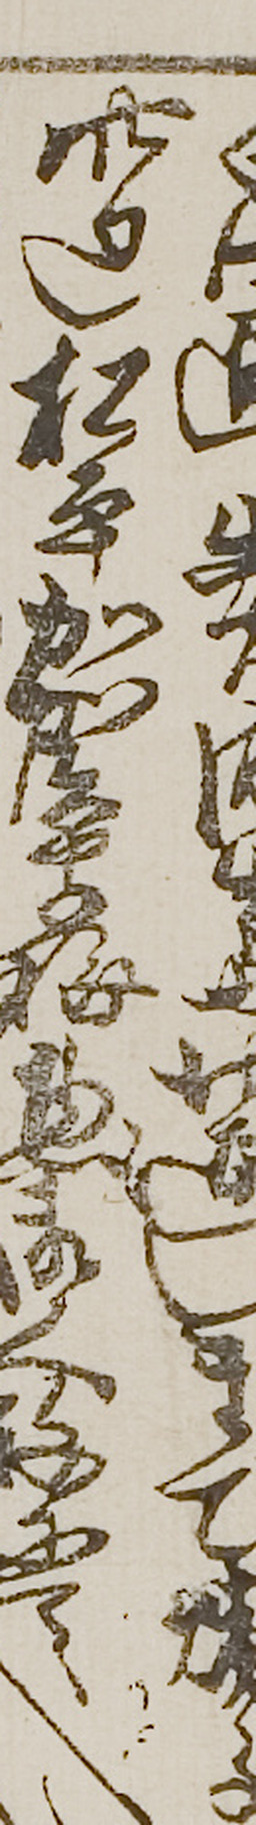此辺松平加賀守様惣御人数出て
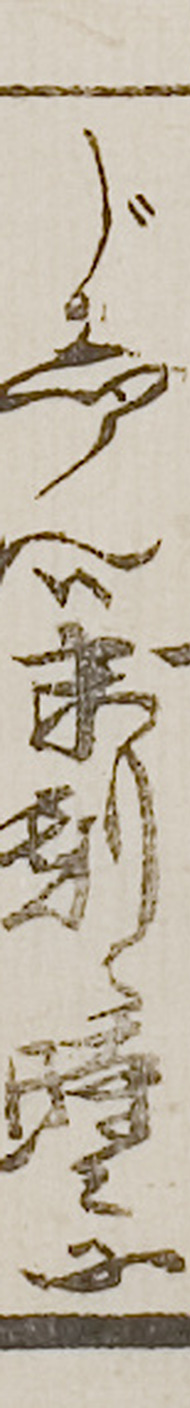じしんは未刻々時々に
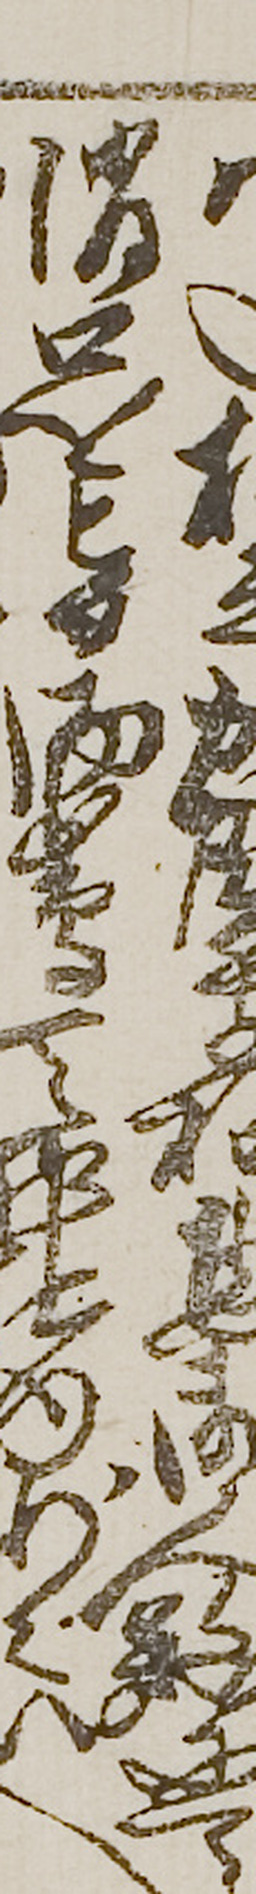消口をとる湯島神社内少々い
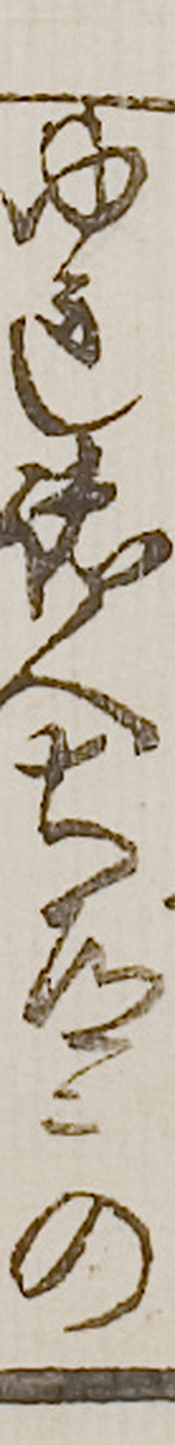ゆれ諸人大道にの
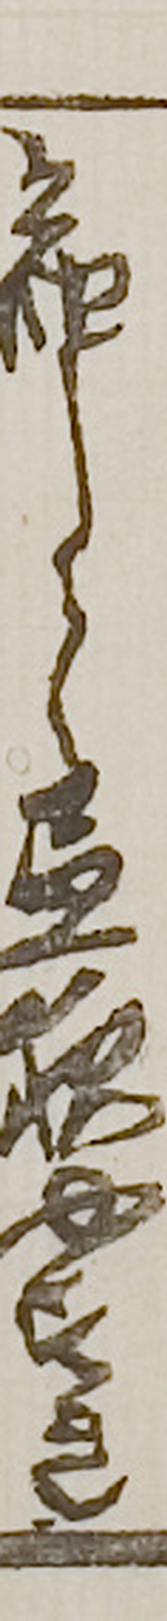宿して昼夜やすき
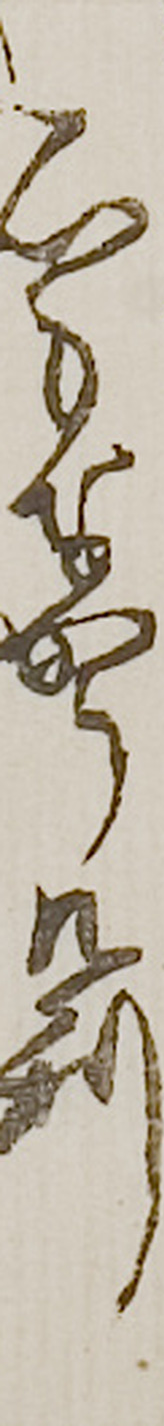心もなかりけり
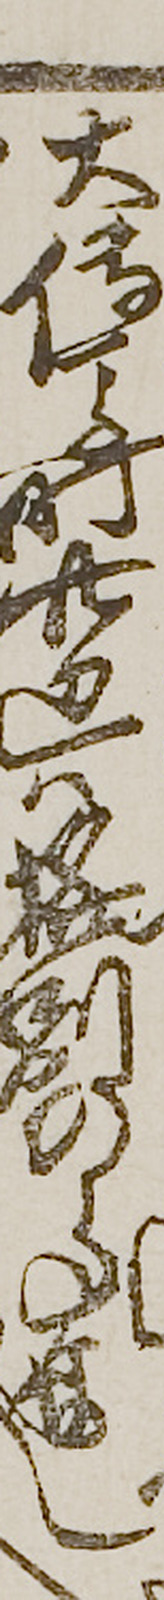大伝馬町此辺は格別の事なし
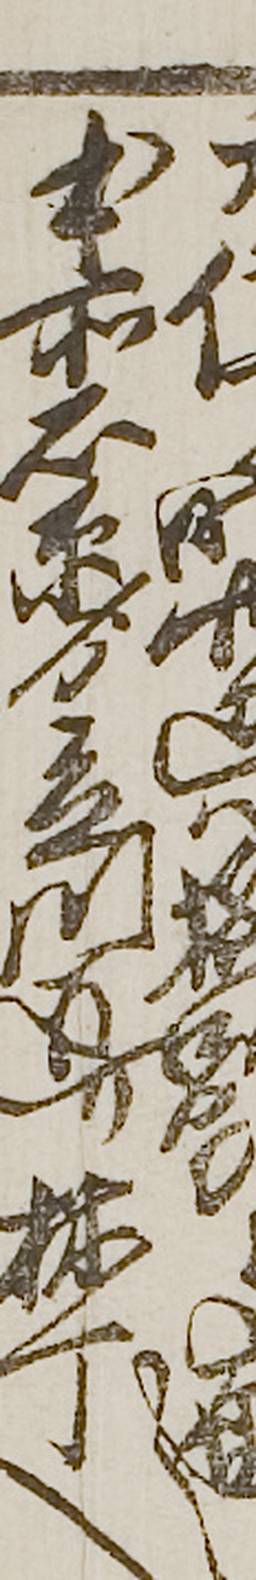本所石原より立川通り林丁
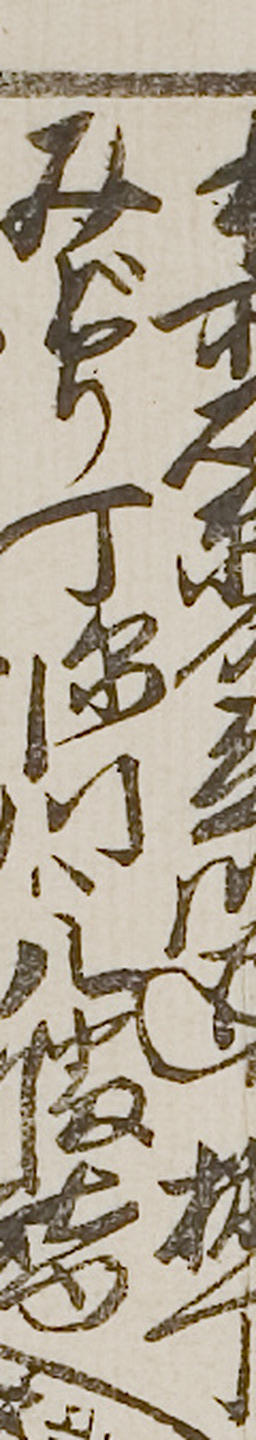みどり丁深川は八幡社内
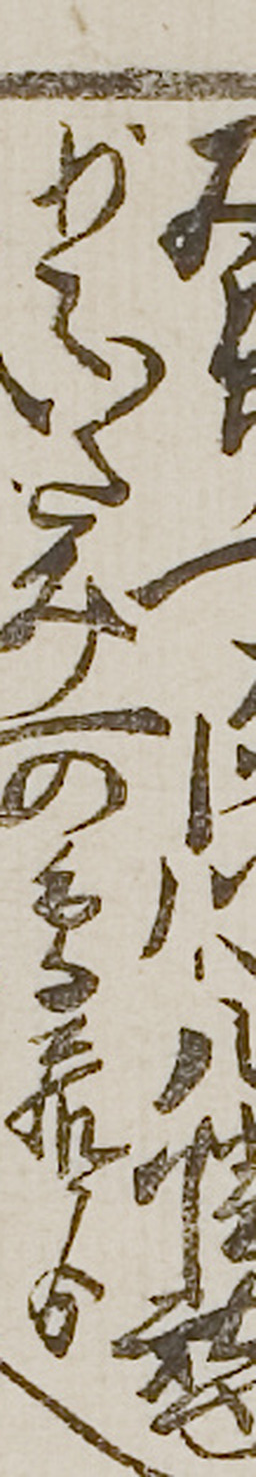少々いたみ一の鳥居より
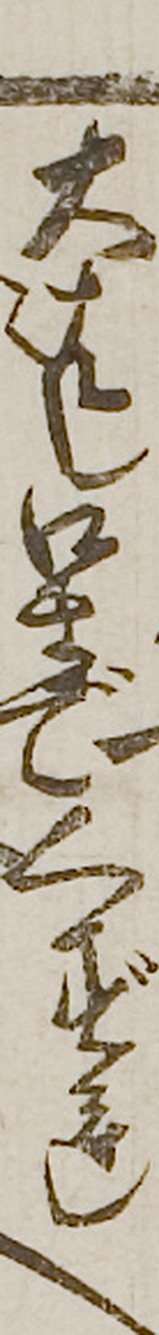大はし口までくずれ
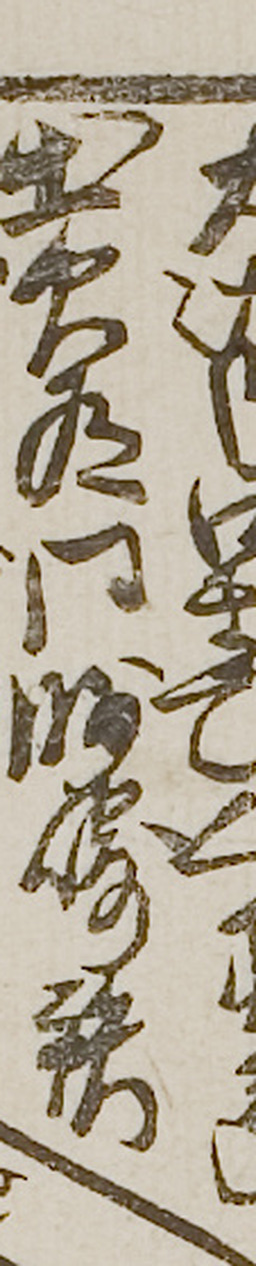出火有同洲崎鉄
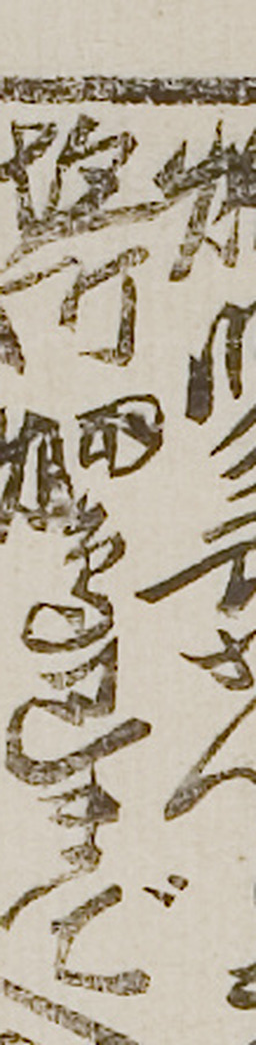塩町畑島まで
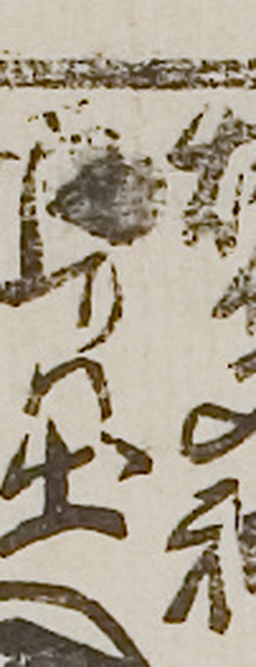通りは出
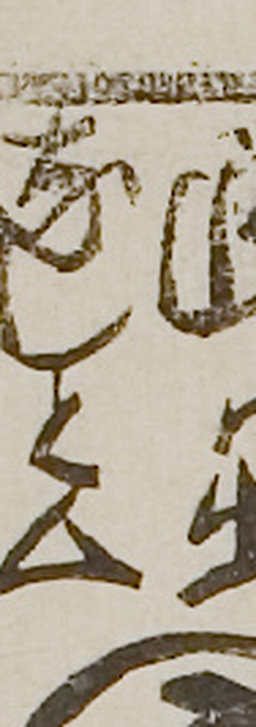なしと△
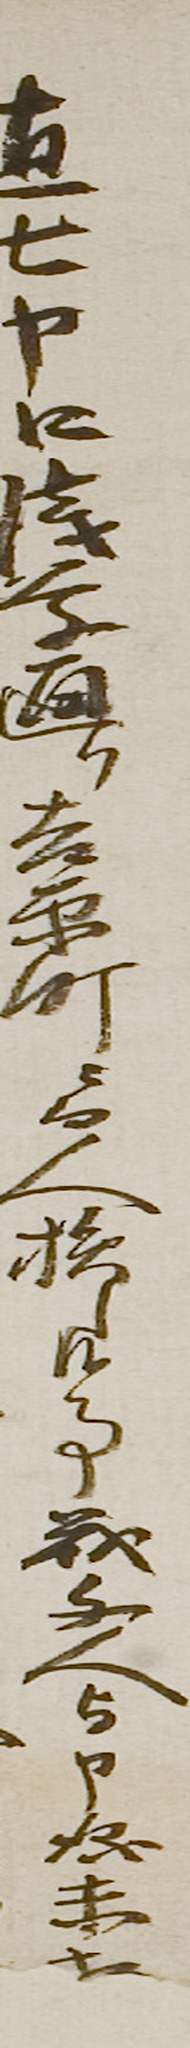直七申口浅草通り吉原町にて人損し候事幾千人と申候未た所々え
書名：[江戸大地震]
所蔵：東京大学総合図書館 General Library in the University of Tokyo, JAPAN
